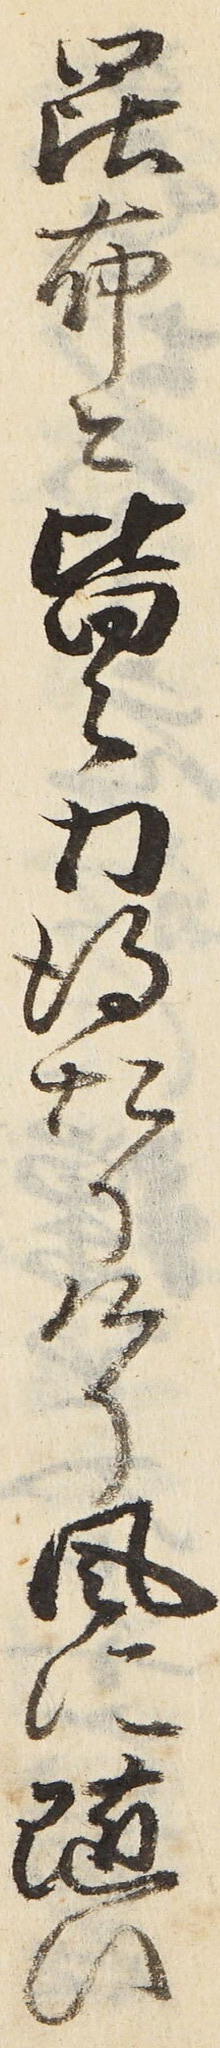昆布と皆々力得たりけり風に随ひ
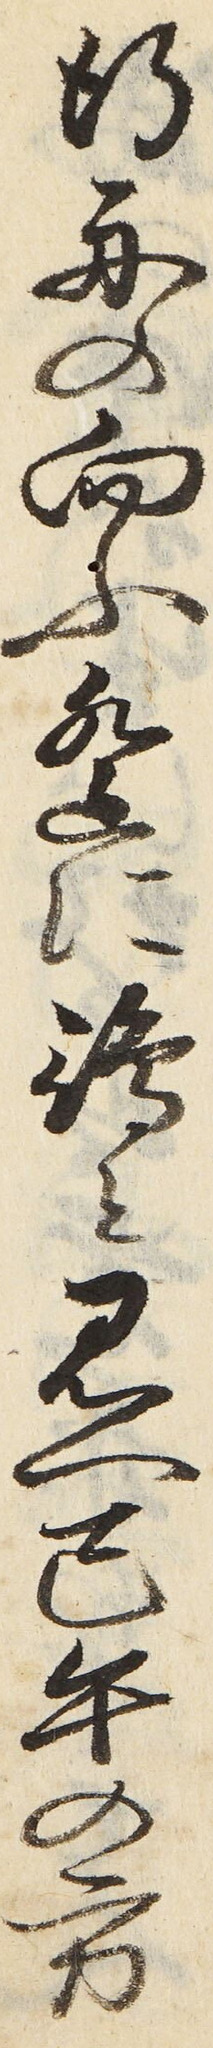行舟の向ふ遥に嶋と見へ巳午の方
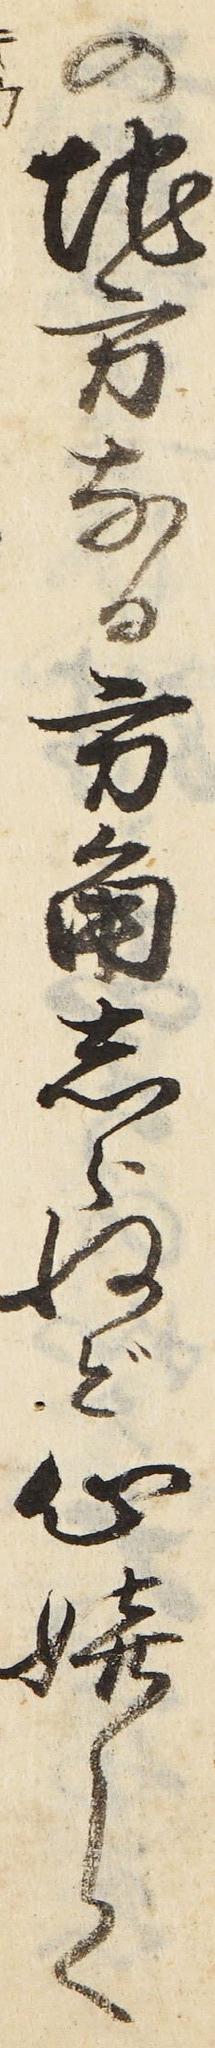の地方なる方角しらねど心嬉しく
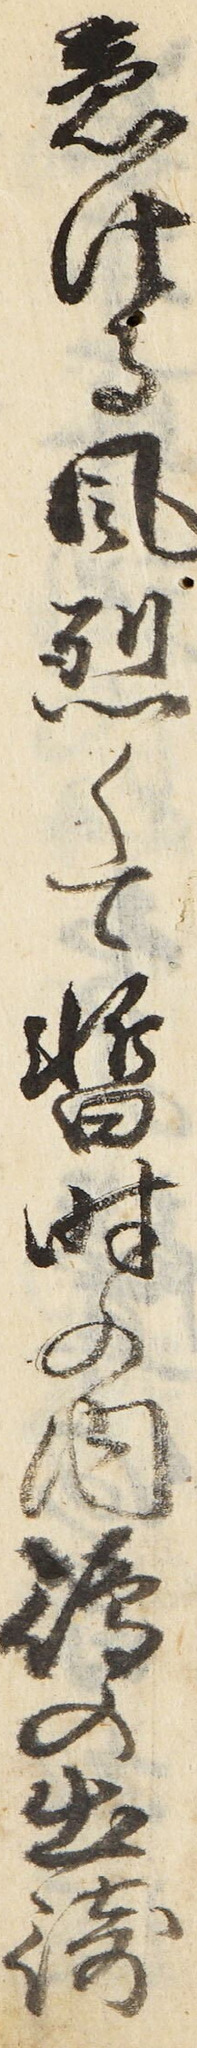急ける風烈くて暫時の内嶋の出崎
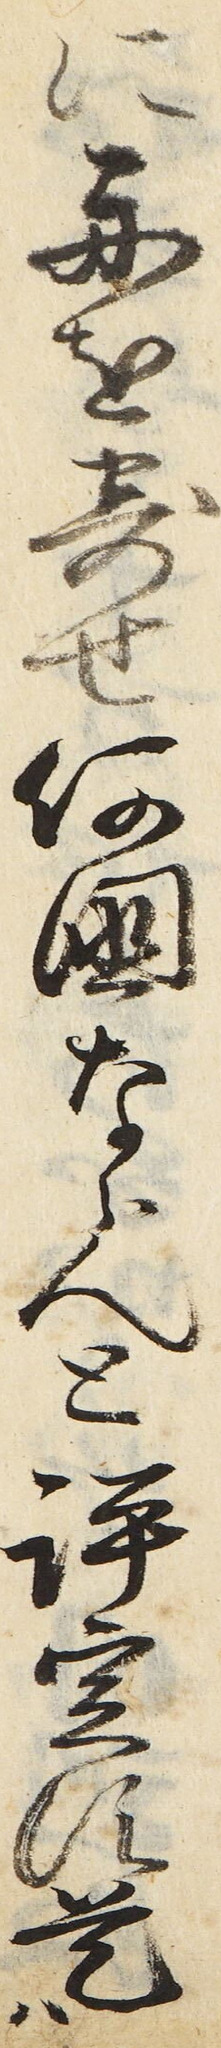に舟を寄せ何国ならんと評定す是は
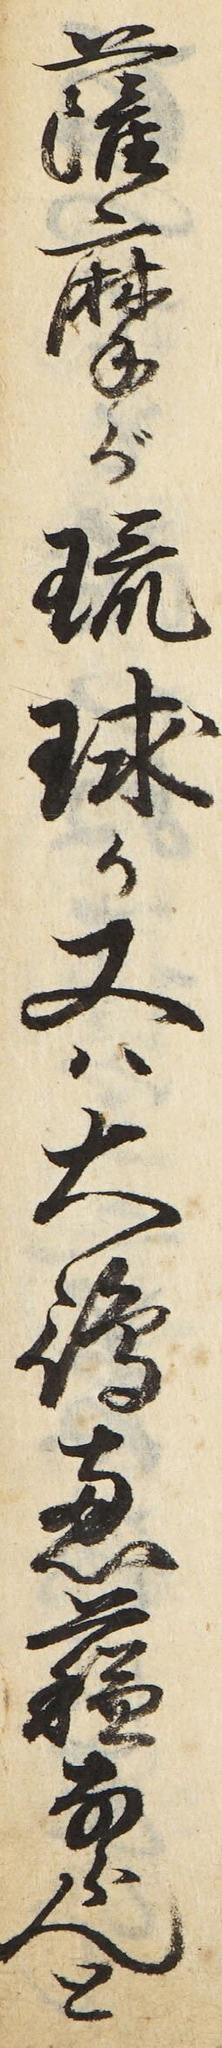薩摩が琉球か又は大嶋恵蘇ならんと

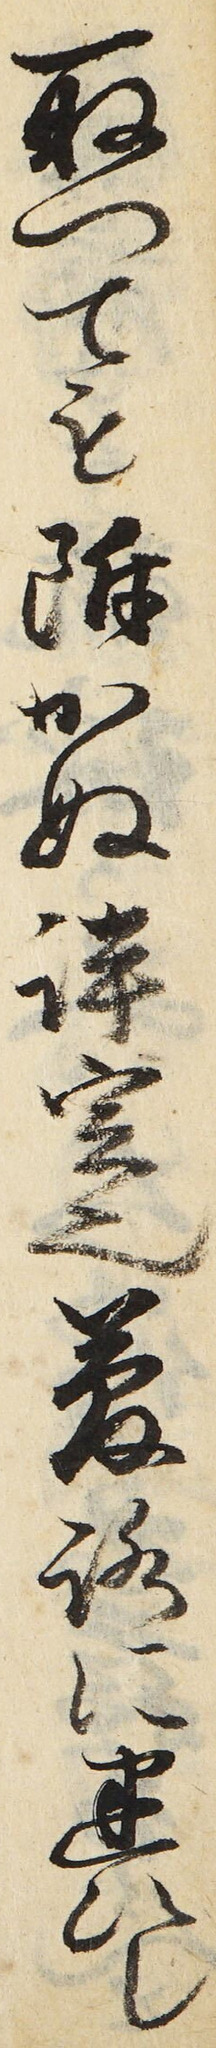取つても附かぬ評定也夢路に迷ひし
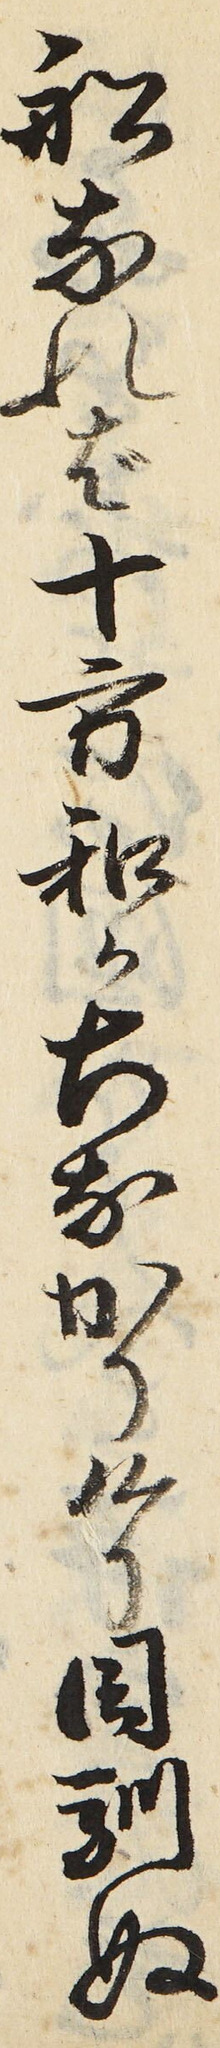船なれば十方和かちなかりけり目馴ぬ
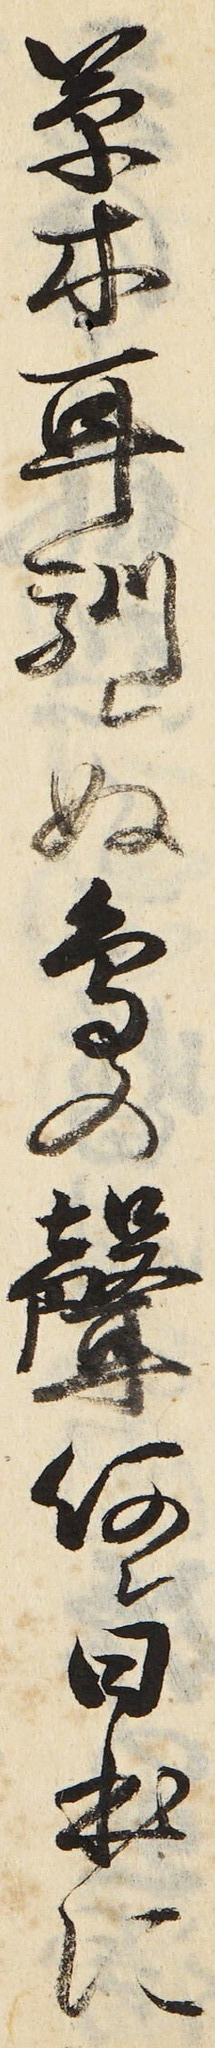草木耳馴れぬ鳥の声何レ日本に
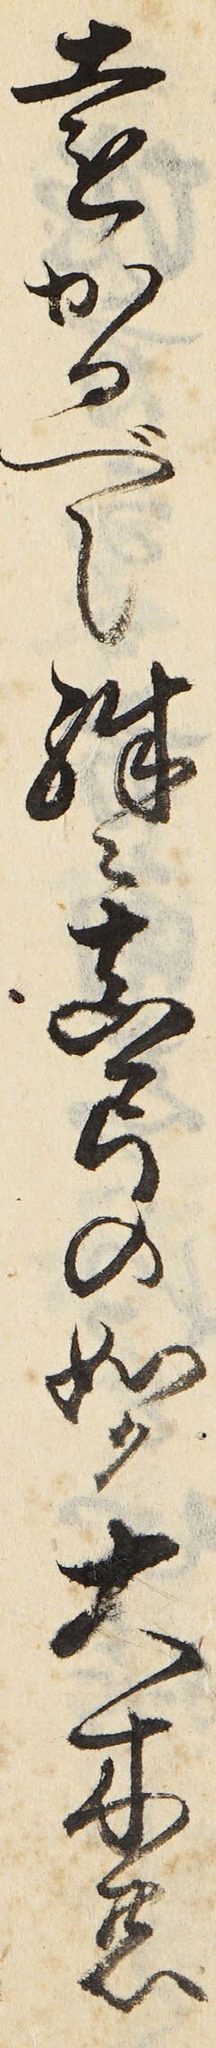土もかるべし殊に真弓の如く大木の
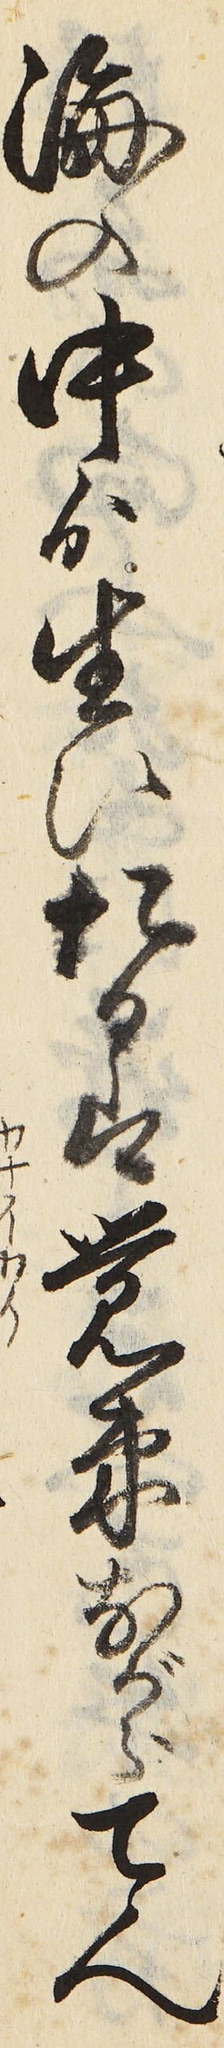海の中ゟ生ひたるは覚束ながらてん
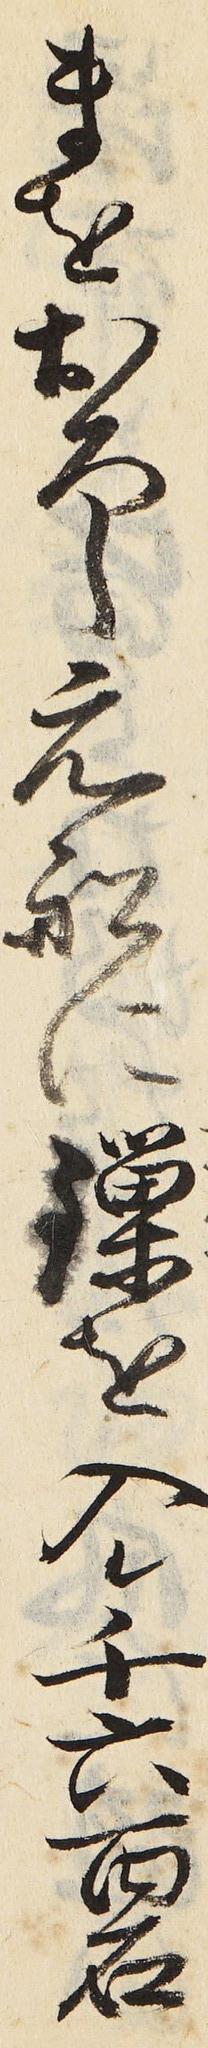まをおろし元船に鏁を入れ千六百石
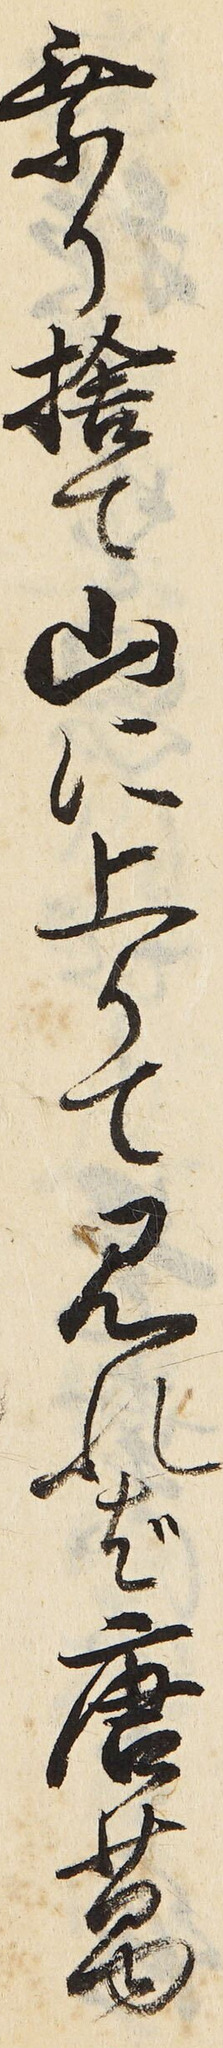乗り捨て山に上りて見れば唐葛
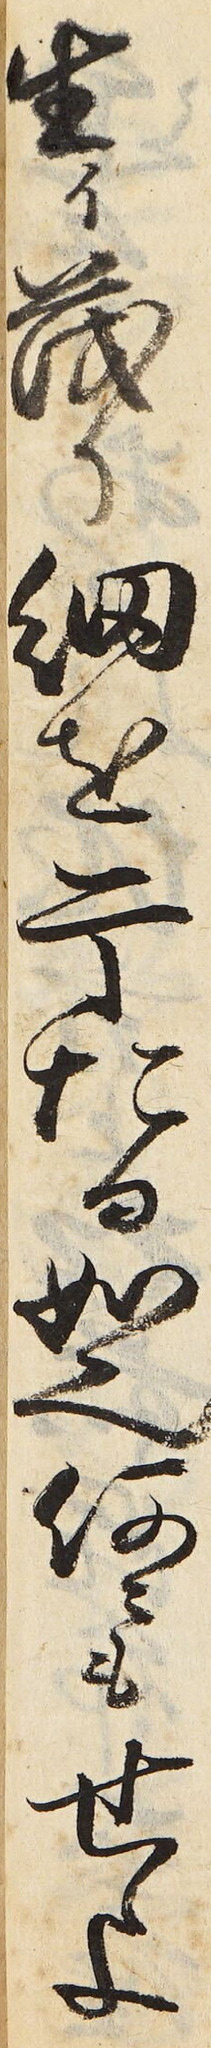生い茂り網を干たる如也何にもせよ
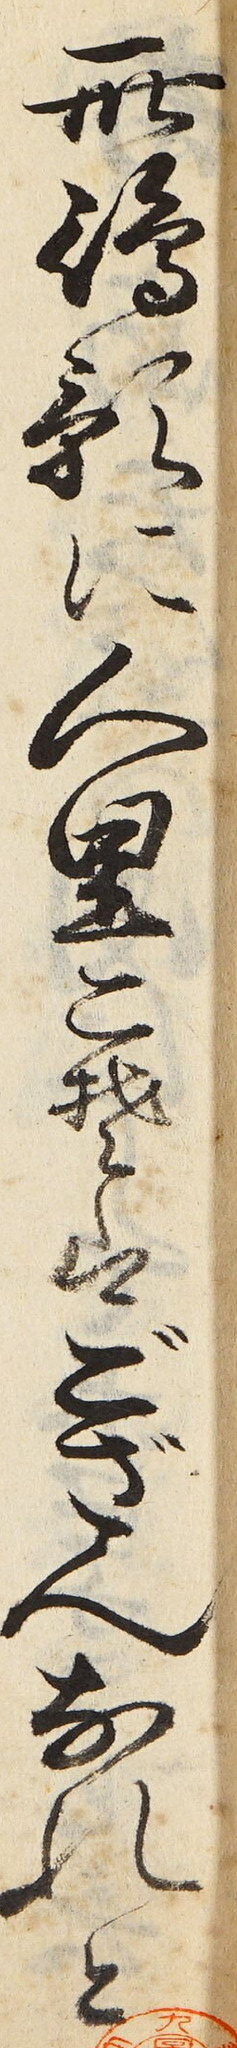此嶋影に人里こそはござんなれと
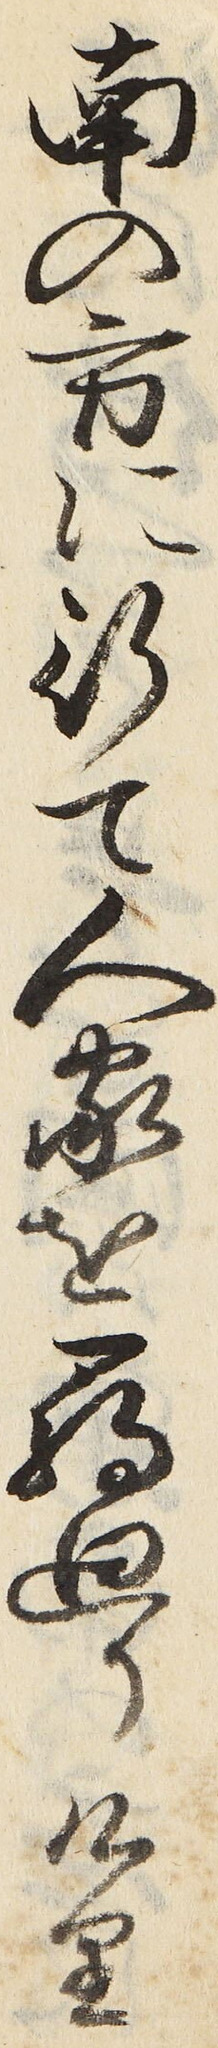南の方に行て人家を尋廻りけり
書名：華夷九年録
